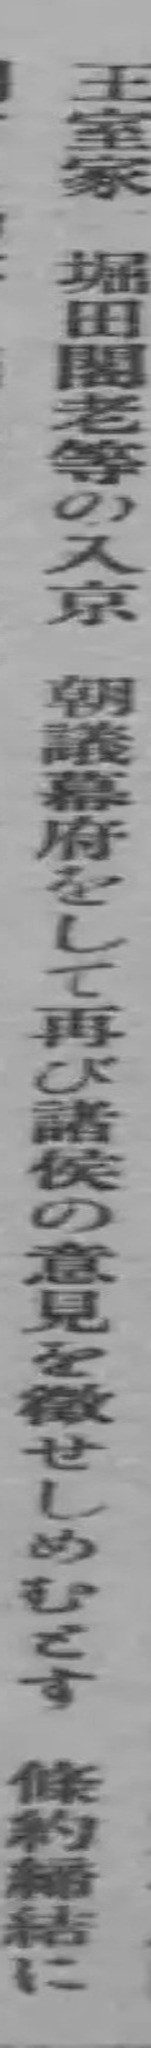王室家堀田閣老等の入京朝議幕府をして再び諸侯の意見を徴せしめむとす条約締結に
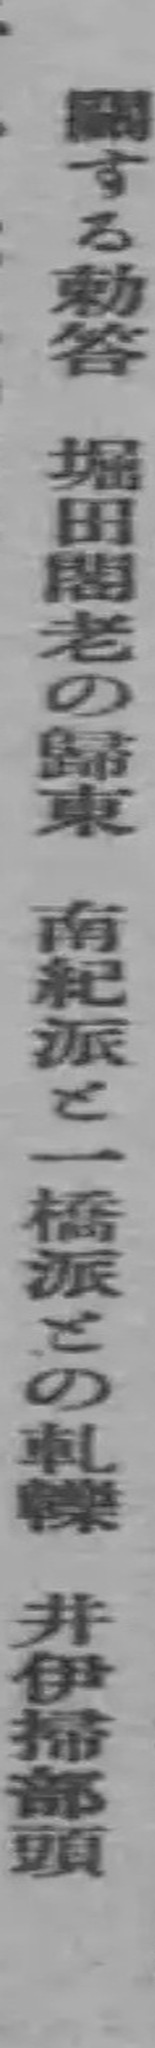関する勅答堀田閣老の帰東南紀派と一橋派との軋轢井伊掃部頭
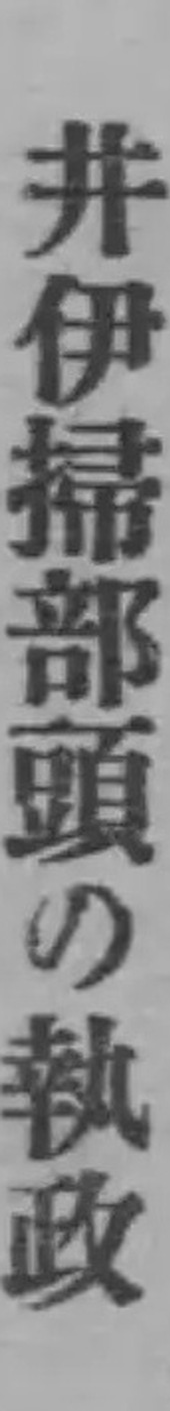井伊掃部頭の執政
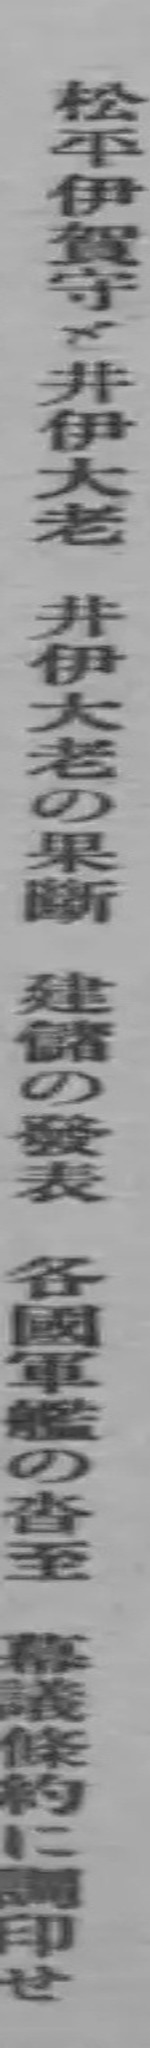松平伊賀守と井伊大老井伊大老の果断建儲の発表各国軍艦の沓至幕議条約に調印せ
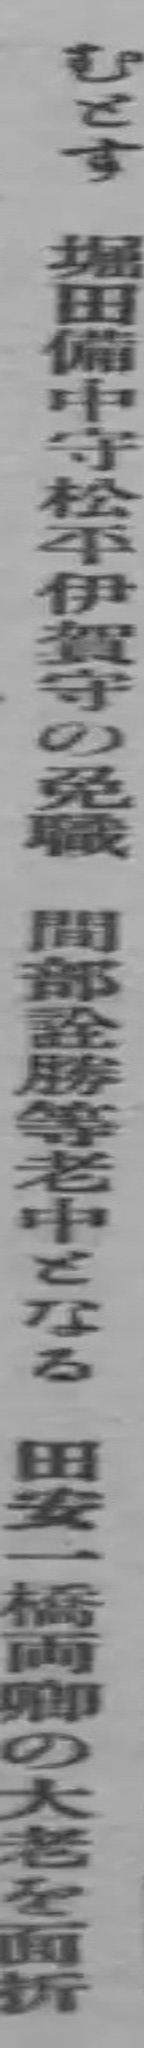むとす堀田備中守松平伊賀守の免職間部詮勝等老中となる田安一橋両卿の大老を面折
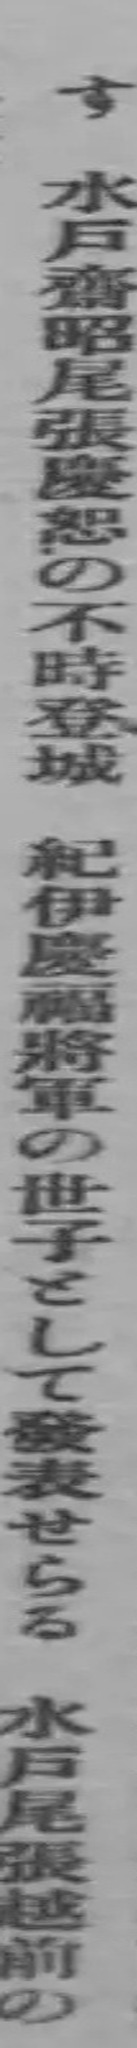す水戸斉昭尾張慶怒の不時登城紀伊慶福将軍の世子として発表せらる水戸尾張越前の
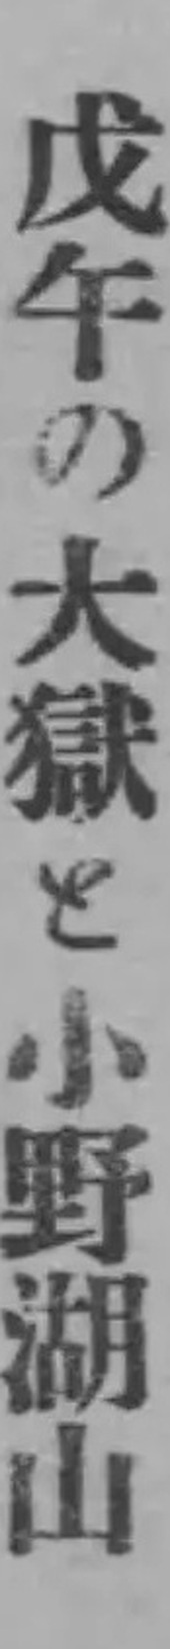戊午の大獄と小野湖山
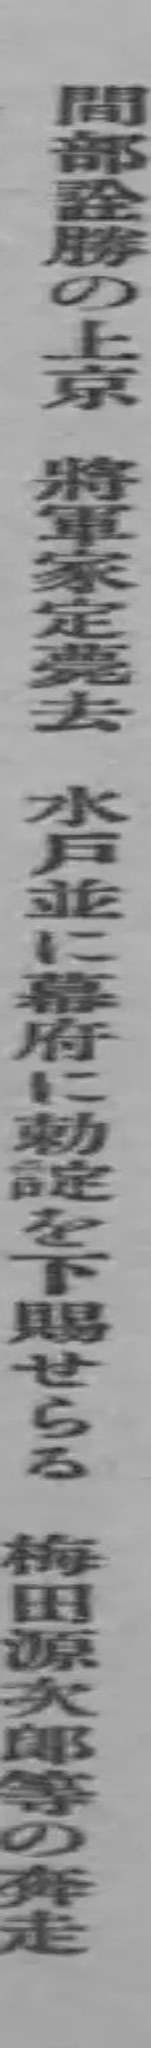間部詮勝の上京将軍家定薨去水戸並に幕府に勅諚を下賜せらる梅田源次郎等の奔走
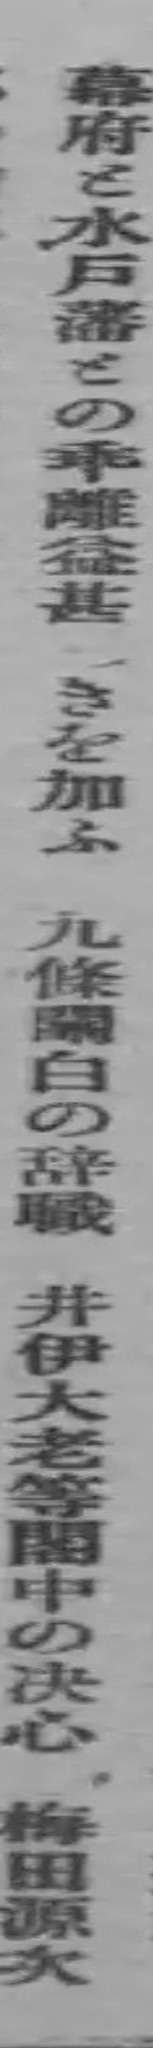幕府と水戸藩との乖離益甚しきを加ふ九条関白の辞職井伊大老等閣中の決心梅田源次
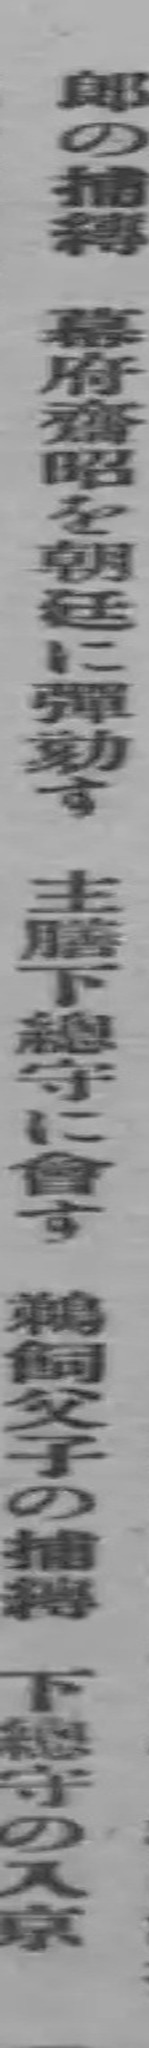郎の捕縛幕府斉昭を朝廷に弾劾す主膳下総守に会す鵜飼父子の捕縛下総守の入京
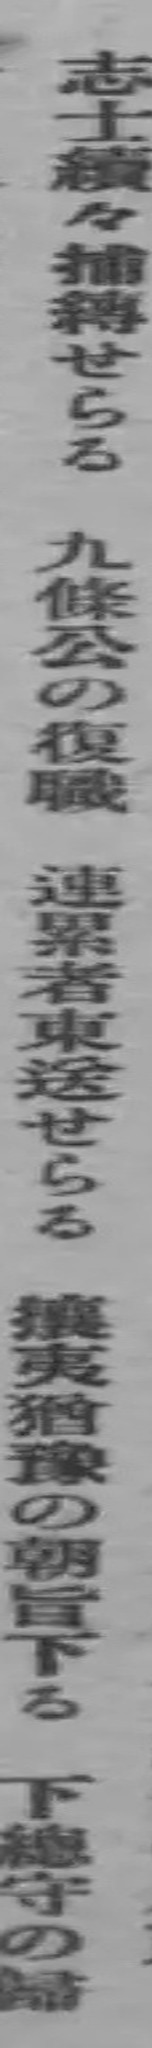志士続々捕縛せらる九条公の復職連累者東送せらる攘夷猶予の朝旨下る下総守の帰
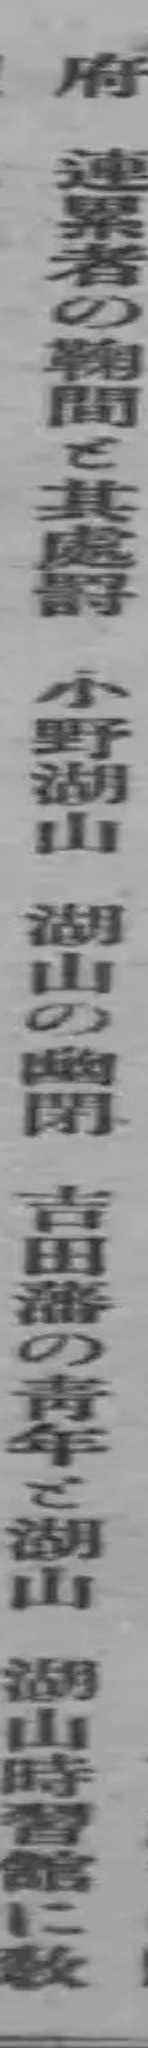府連累者の鞠間と其処罰小野湖山湖山の幽閉吉田藩の青年と湖山湖山時習館に教
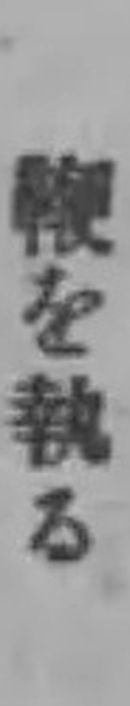鞭を執る
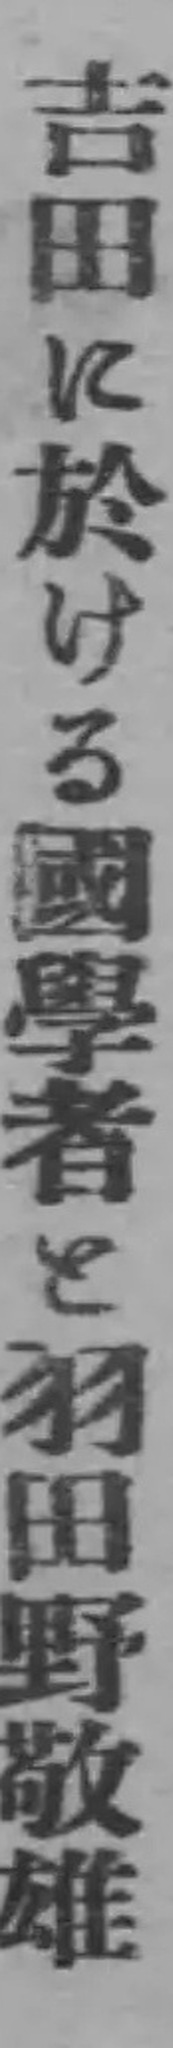吉田に於ける国学者と羽田野敬雄
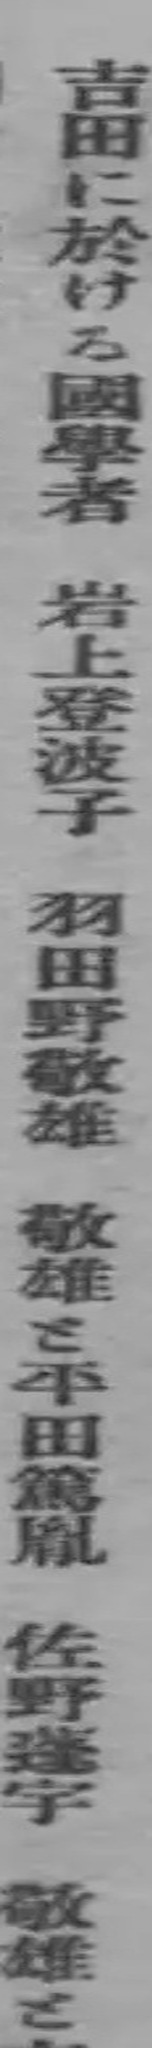吉田に於ける国学者岩上登波子羽田野敬雄敬雄と平田篤胤佐野蓬宇敬雄と志士
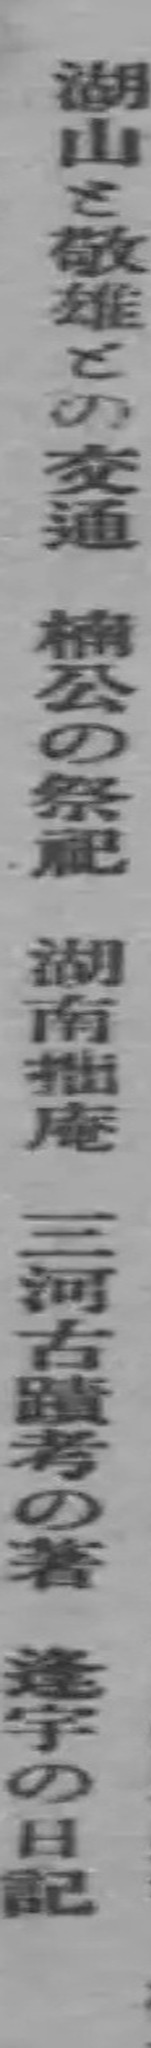湖山と敬雄との交通楠公の祭祀湖南拙庵三河古蹟考の著逢宇の日記
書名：豊橋市史談
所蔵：国立国会図書館 National Diet Library, JAPAN
